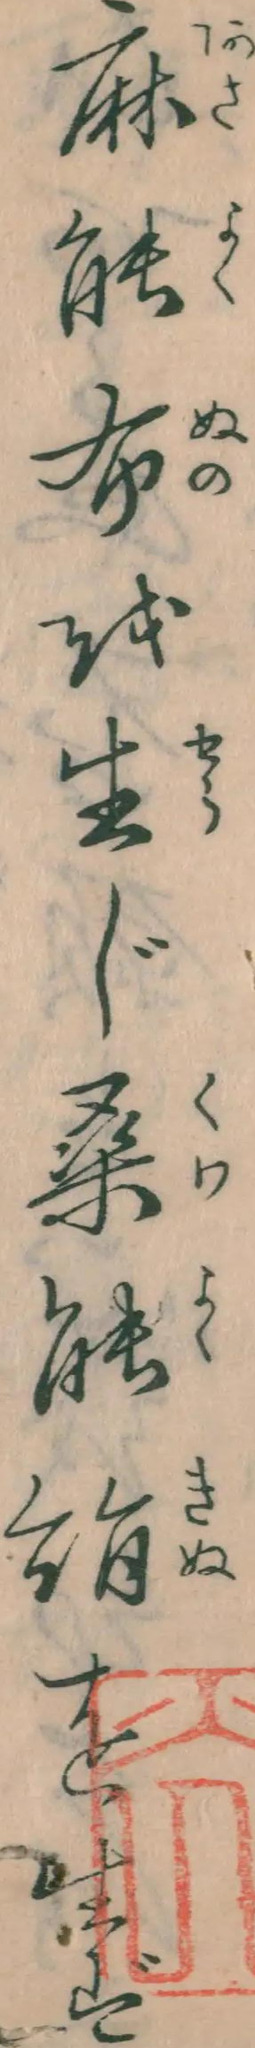麻能布を生じ桑能絹を生ず
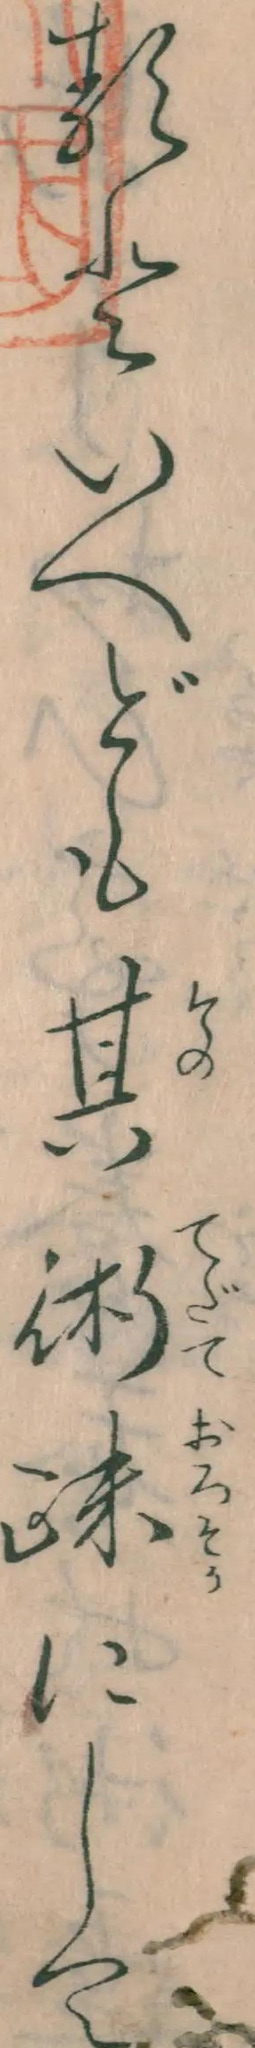るといへども其術疎にして
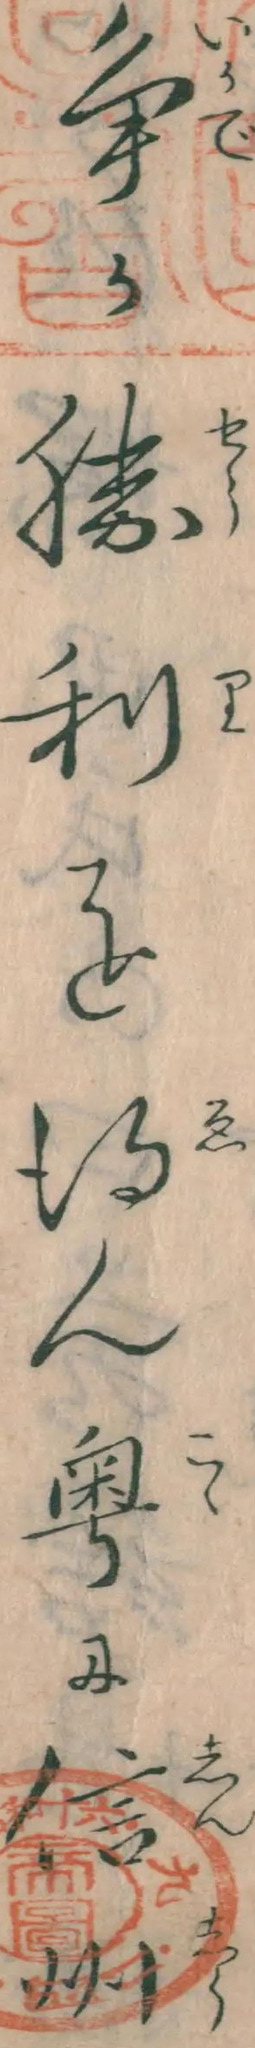争か勝利を得ん粤に信州
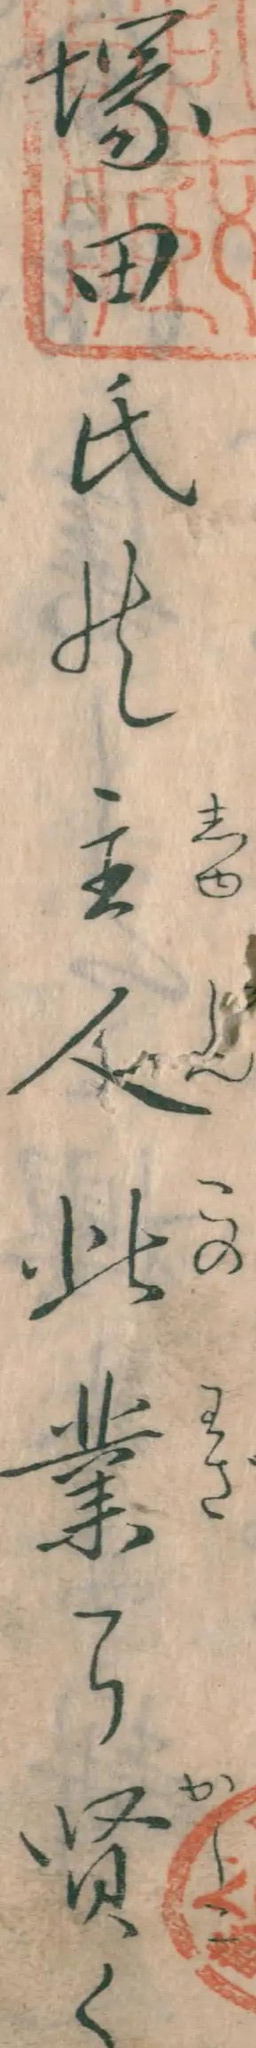塚田氏の主人此業に賢く
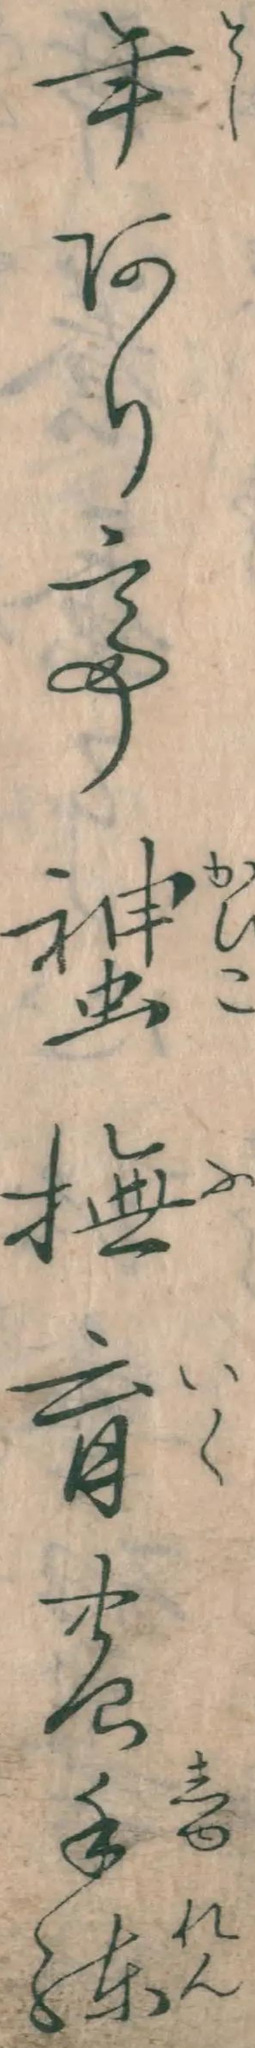年ありて䗝撫育の手練
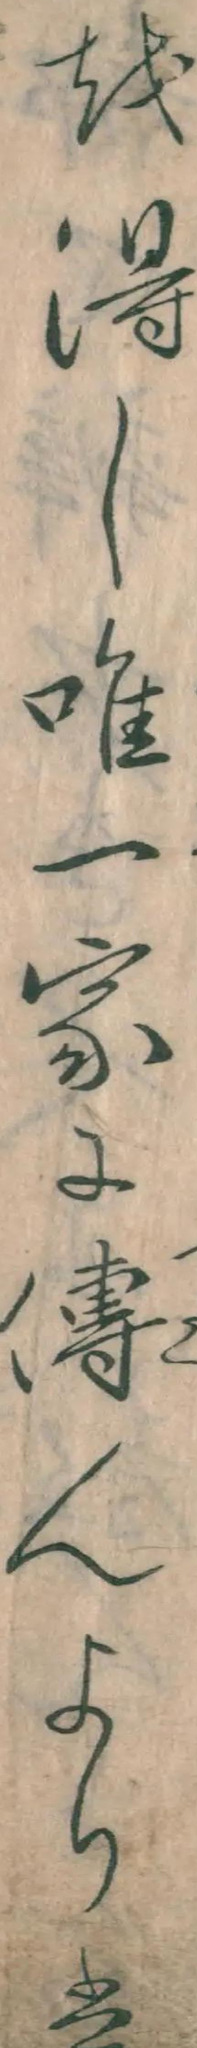を得し唯一家に伝んよりは

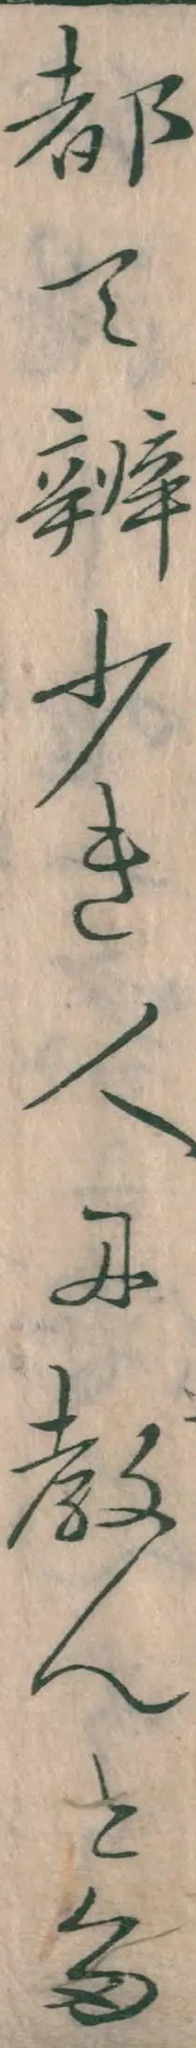都て弁少き人に教んと多
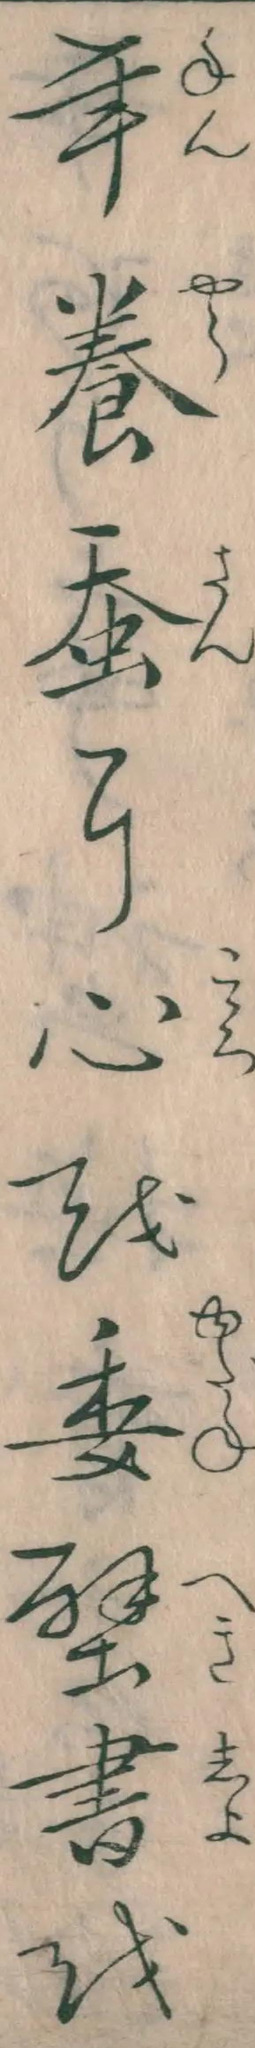年養蚕に心を委壁書を
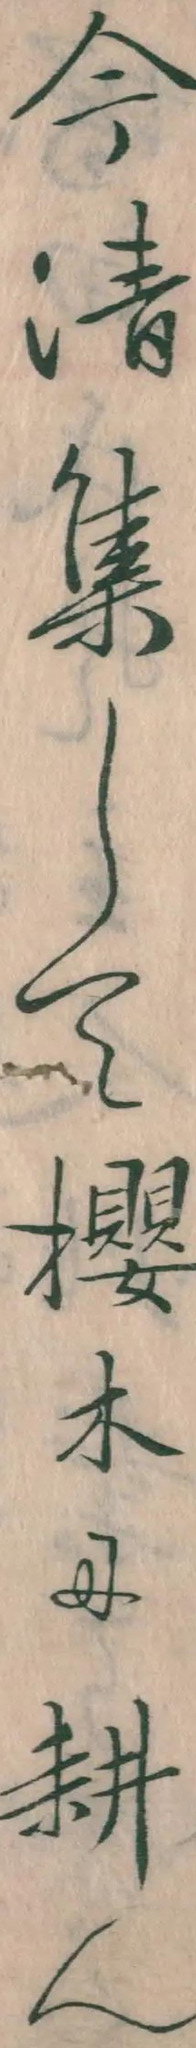今清集して桜木に耕ん
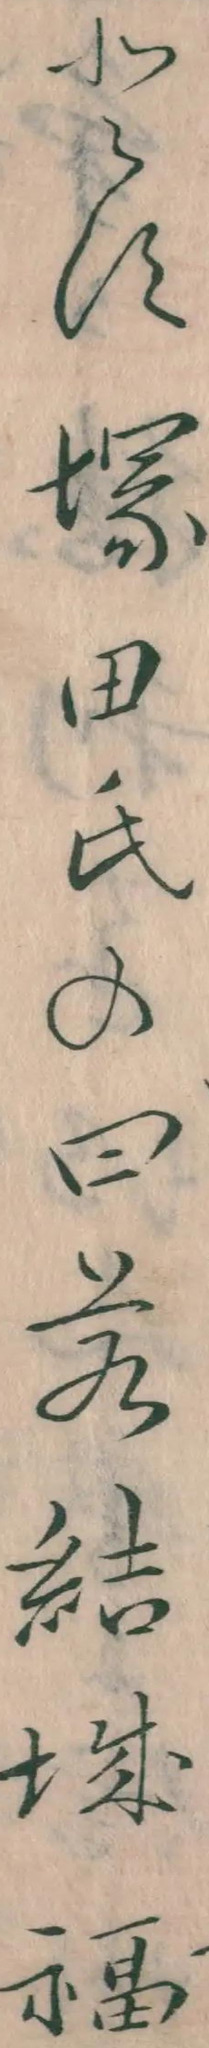とす塚田氏の曰若結城福
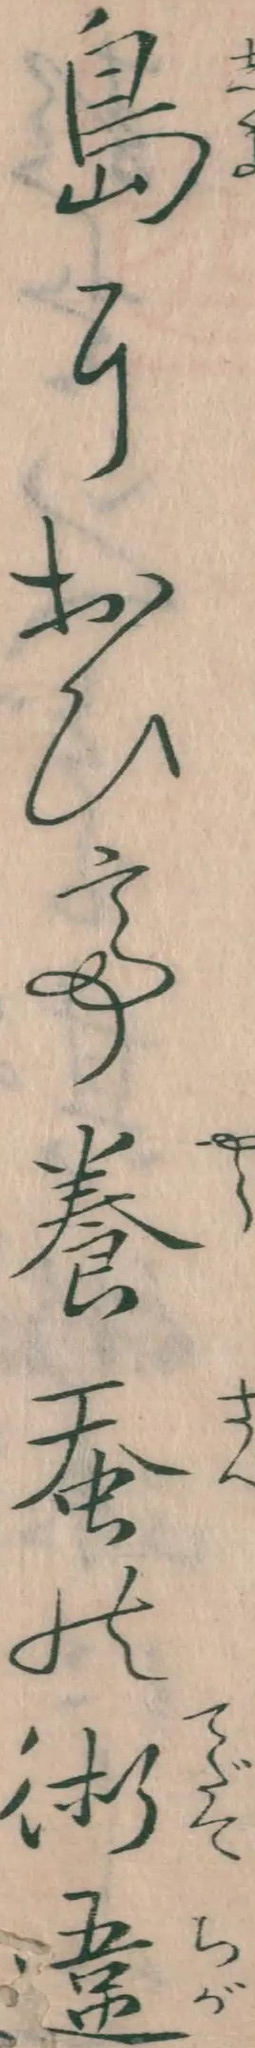島におひて養蚕の術違
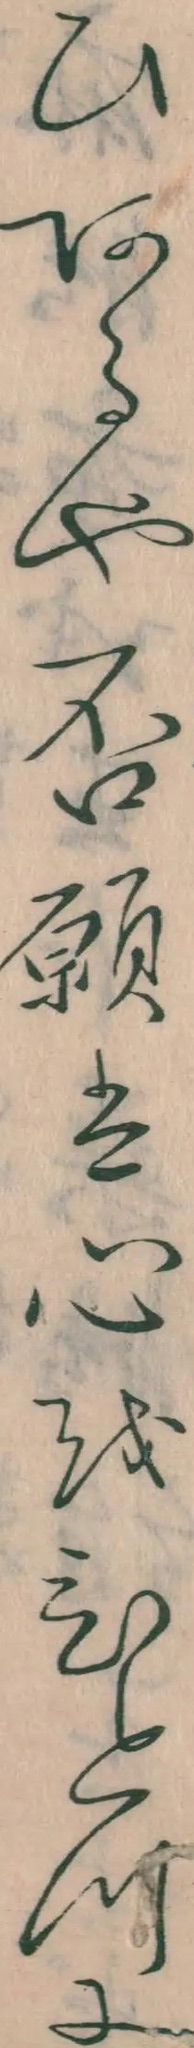ひあるや否願は心をひとつに
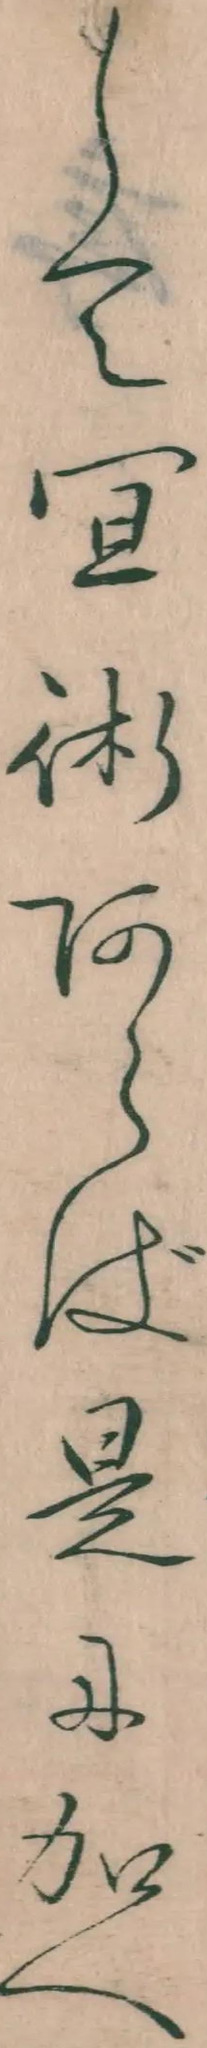して宜術あらば是に加へ
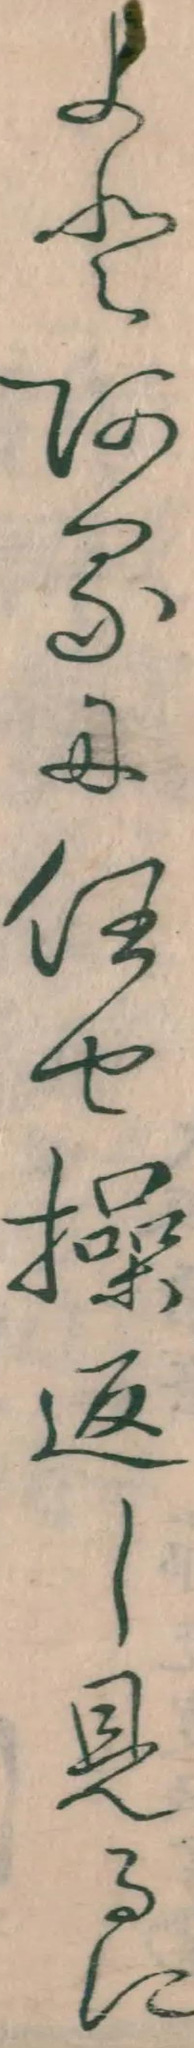よとあるに任せ繰返し見るに
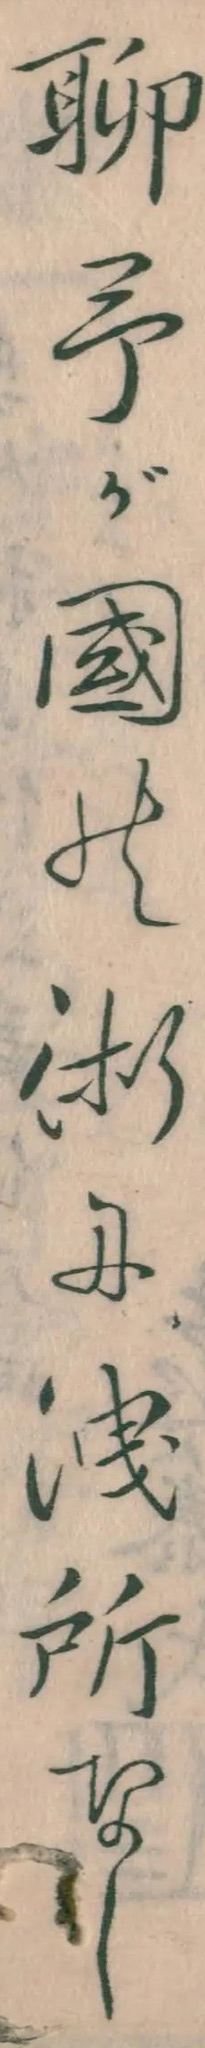聊予が国の術に洩所なし
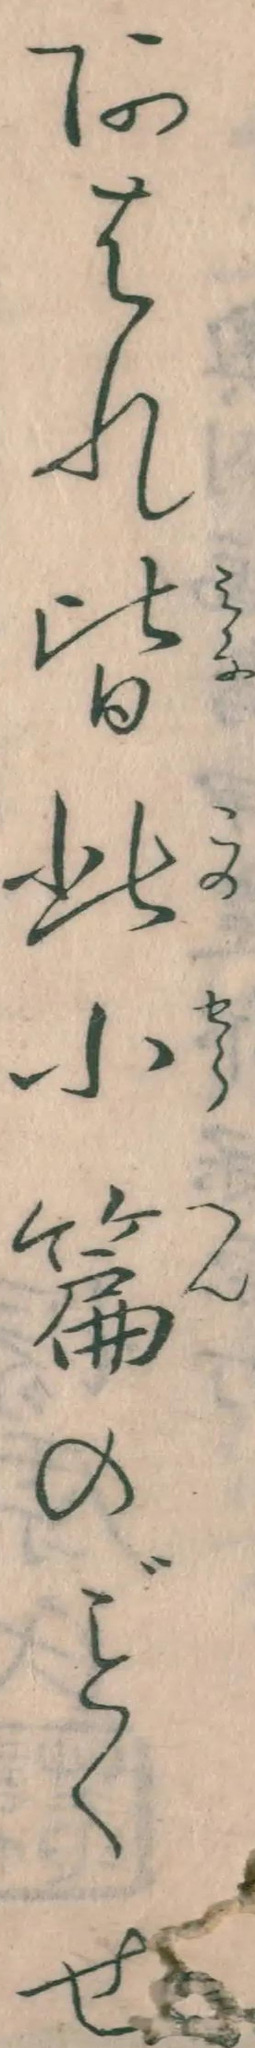あはれ皆此小篇のごとくせ
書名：新撰養蚕秘書
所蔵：国立国会図書館 National Diet Library, JAPAN
